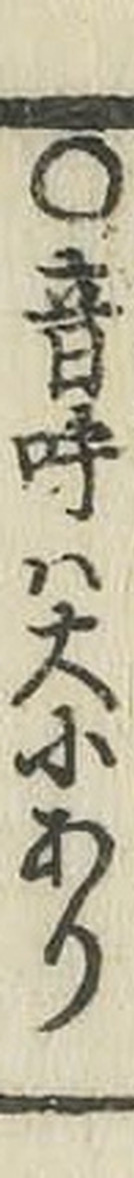○音呼は大小あり
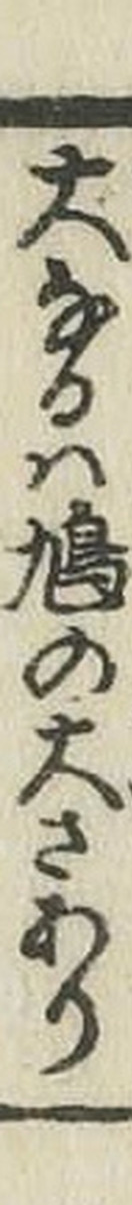大なるは鳩の大さあり
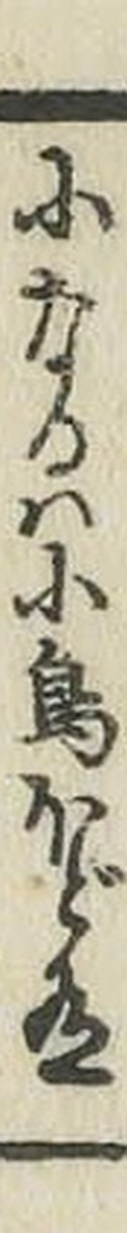小なるは小鳥ほど有
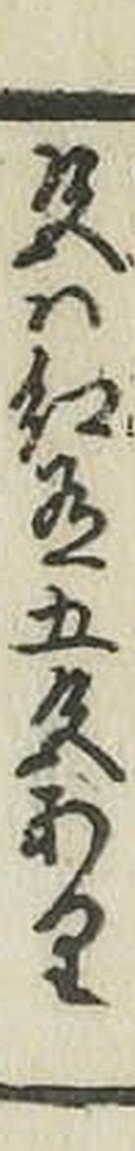色は紅有五色あり
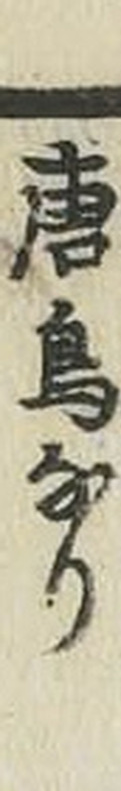唐鳥なり
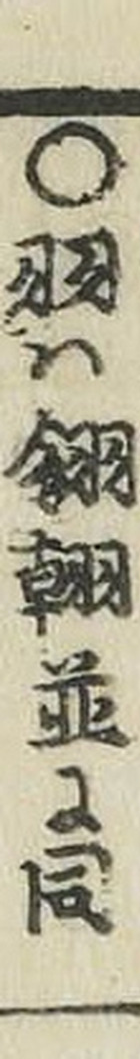○羽は翎翰並に同
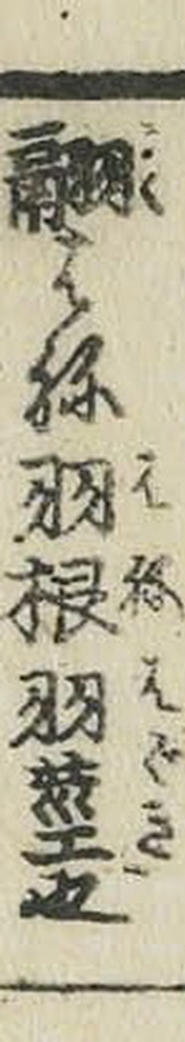翮はね羽根羽茎也
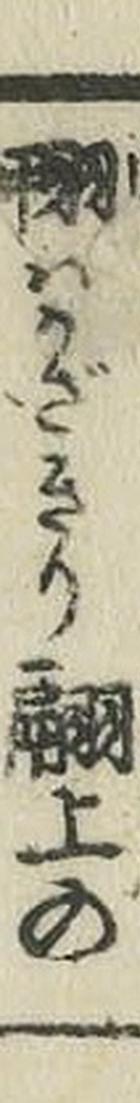翈はかざきり翮上の
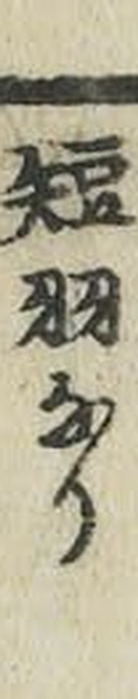短羽なり

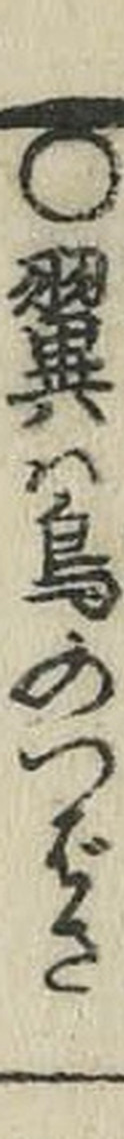○翼は鳥のつばさ
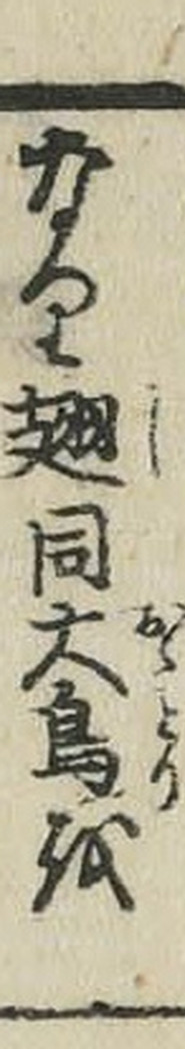なり翅同大鳥を
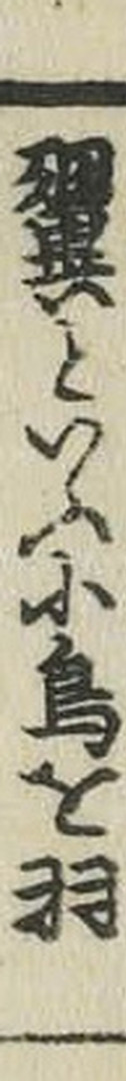翼といふ小鳥を羽
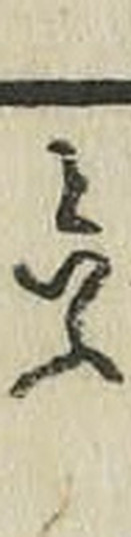といふ
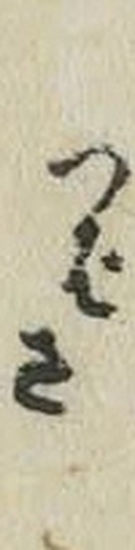つばさ
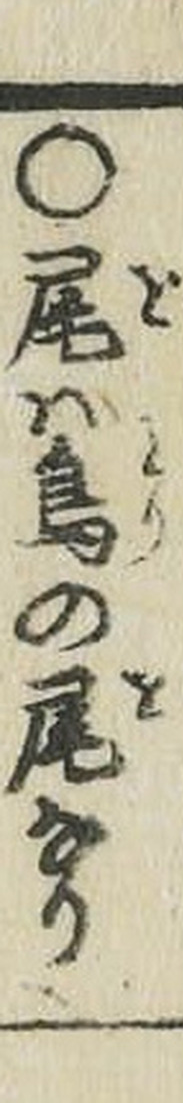○尾は鳥の尾なり
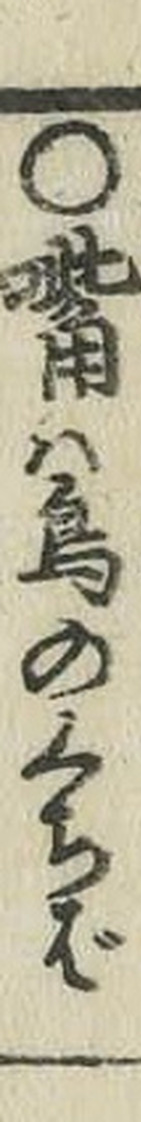○嘴は鳥のくちば
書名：増補頭書訓蒙図彙大成 10巻 6:巻之12-13
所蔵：東京学芸大学教育コンテンツアーカイブ
